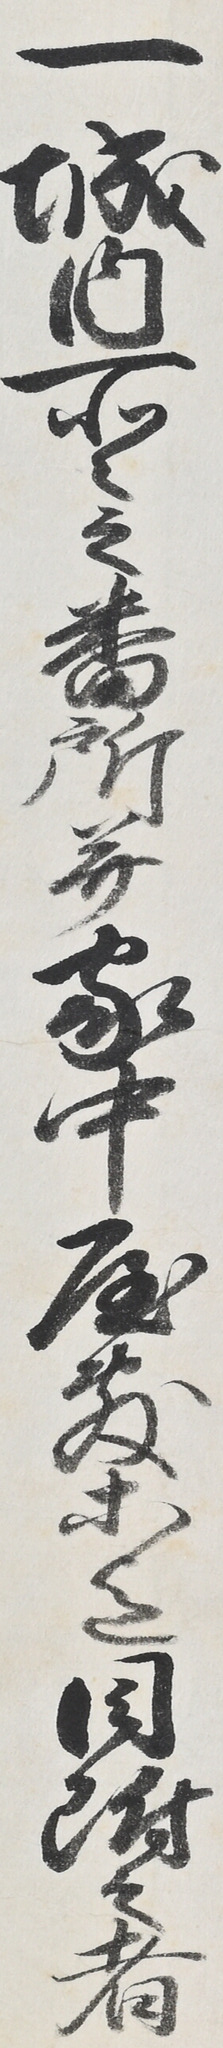一城内所々之番所幷家中屋敷等迄目附之者
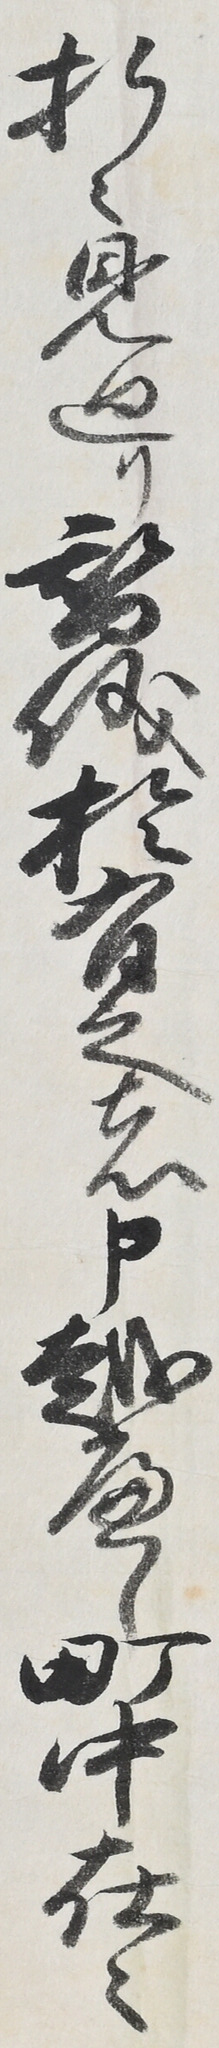折々見廻り替儀於有之者申越へし町中在々
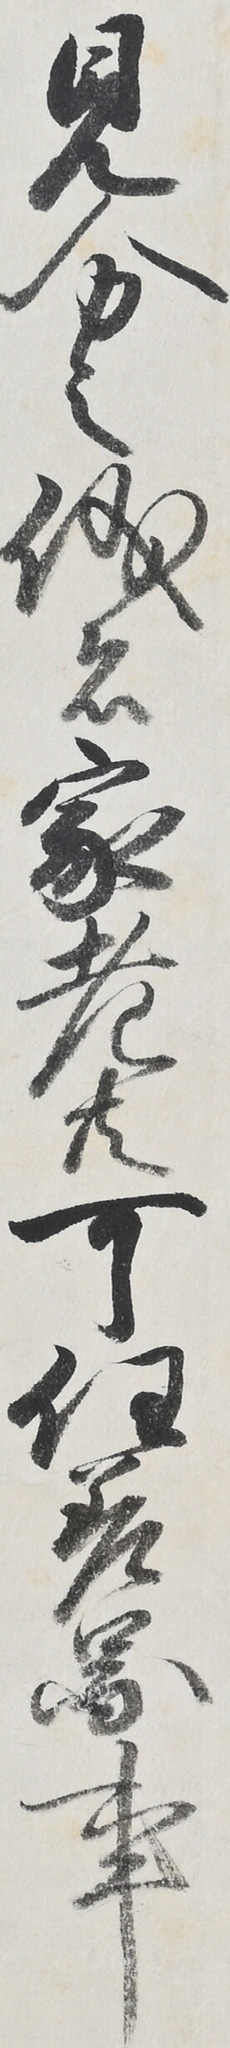見分之儀者家老共可任差図事
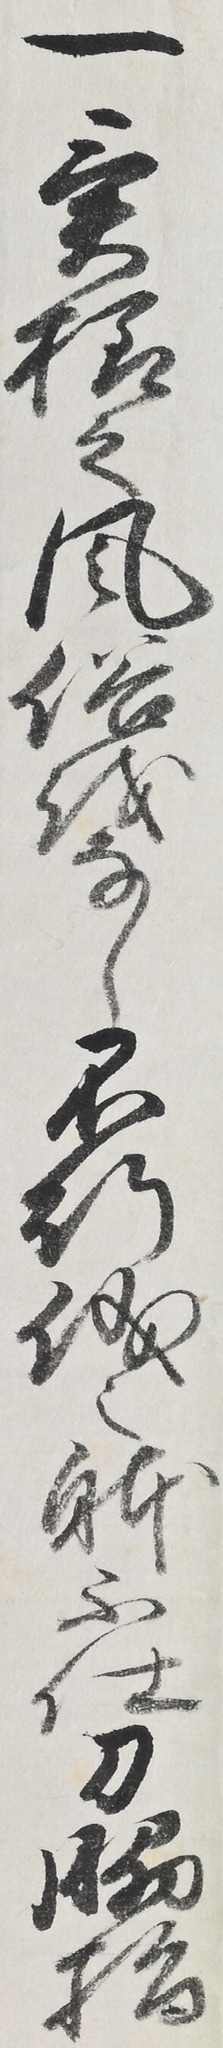一異様之風俗をなし不行儀之躰不仕刀脇指
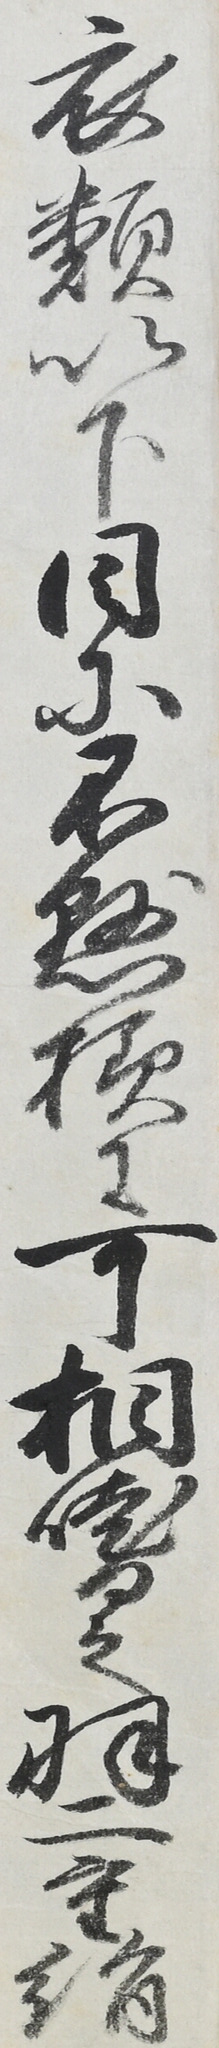衣類以下目に不懸様に可相嗜之羽二重絹
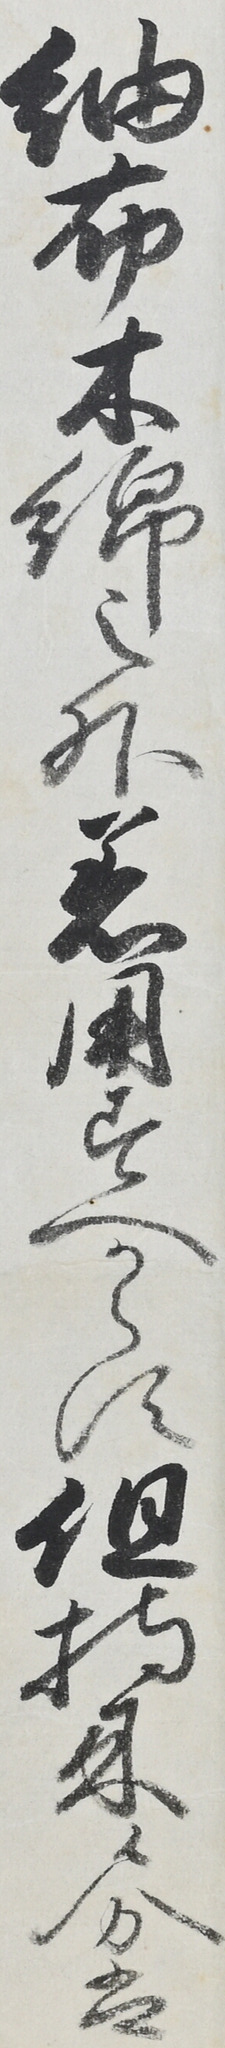紬布木綿之外着用すへからす但持来候分は
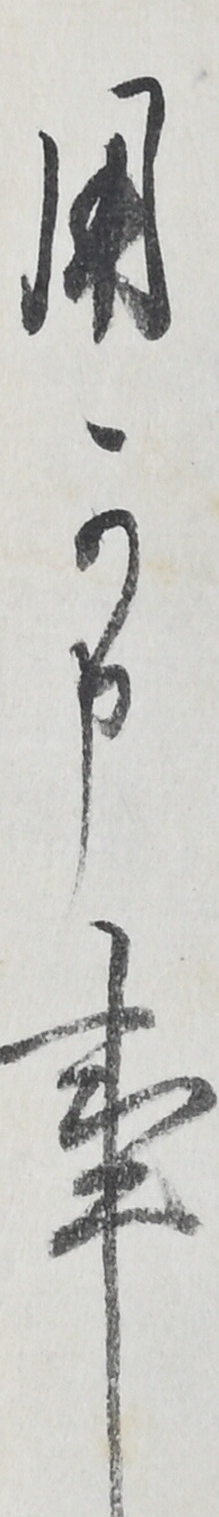用可申事

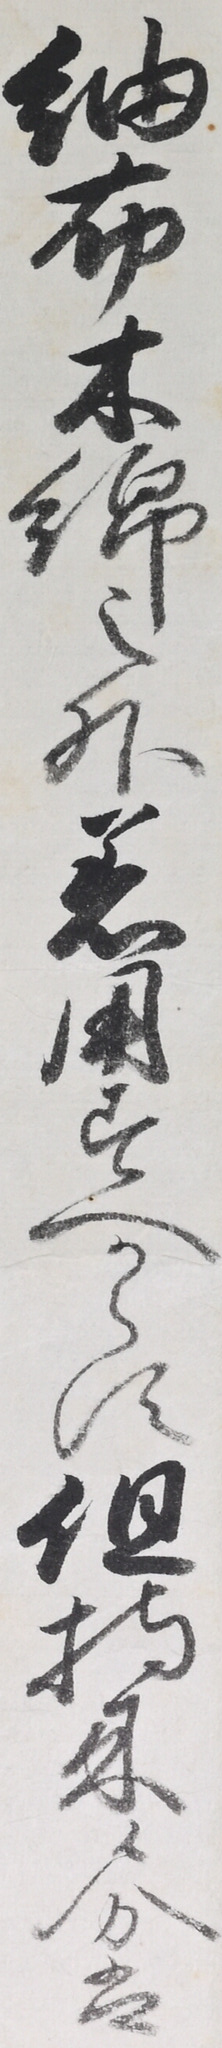紬布木綿之外着用すへからす但持来候分は
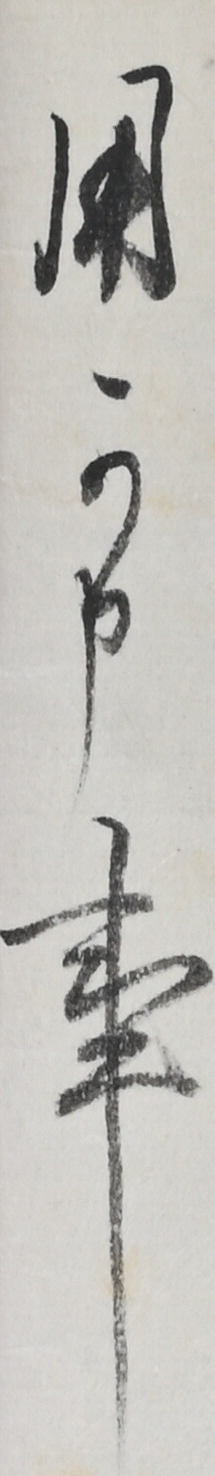用可申事
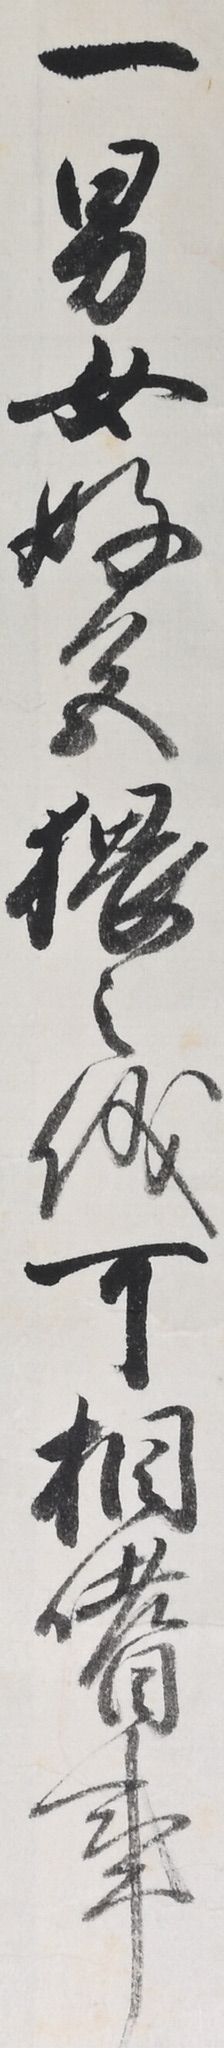一男女好色猥之儀可相嗜事
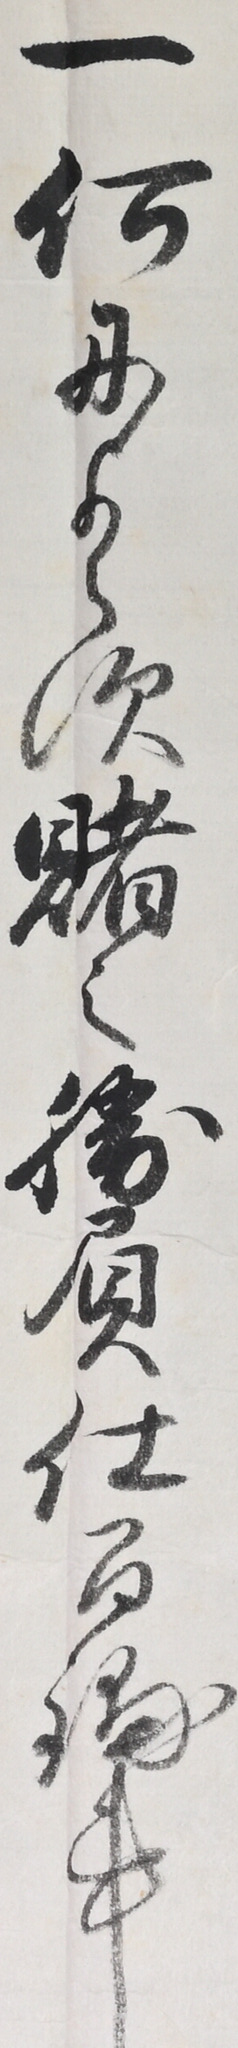一何によらす賭之勝負仕間鋪事
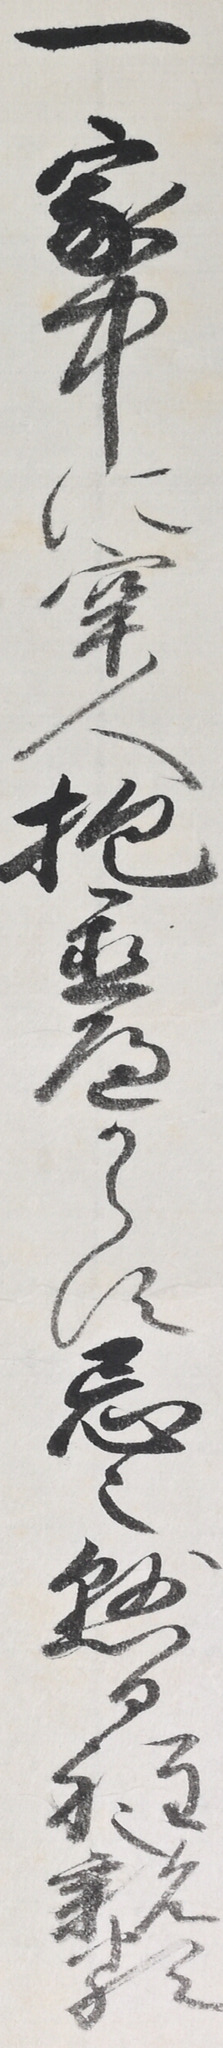一家中に牢人抱置へからす忌之懸る程之親類
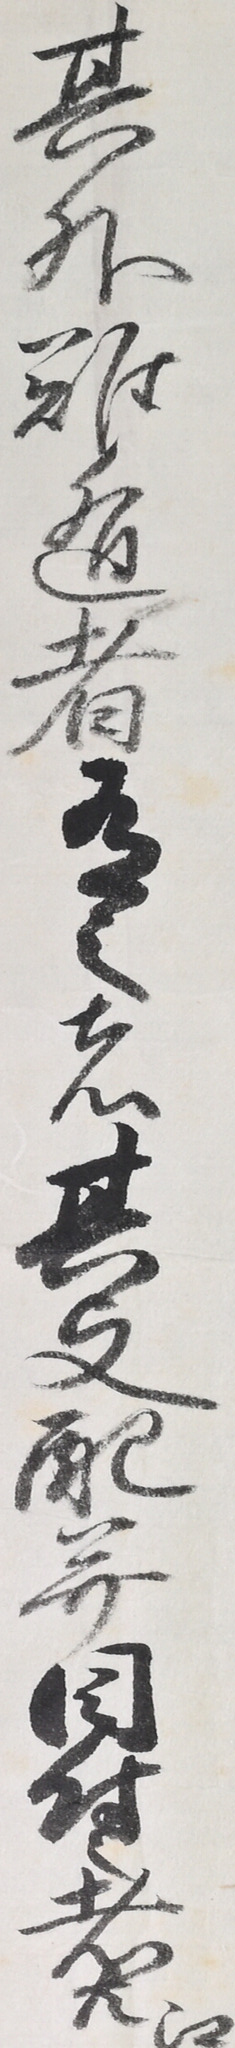其外難遁者有之者其支配幷目付之者共え
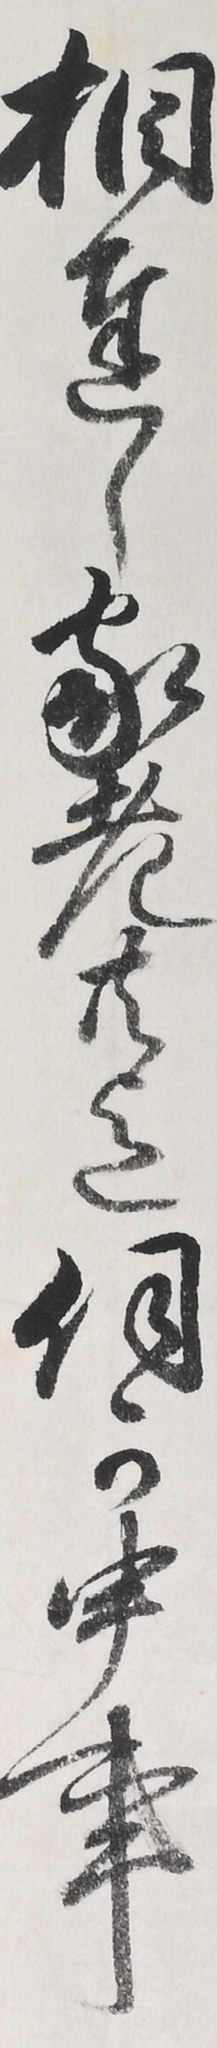相達し家老共迄伺可申事
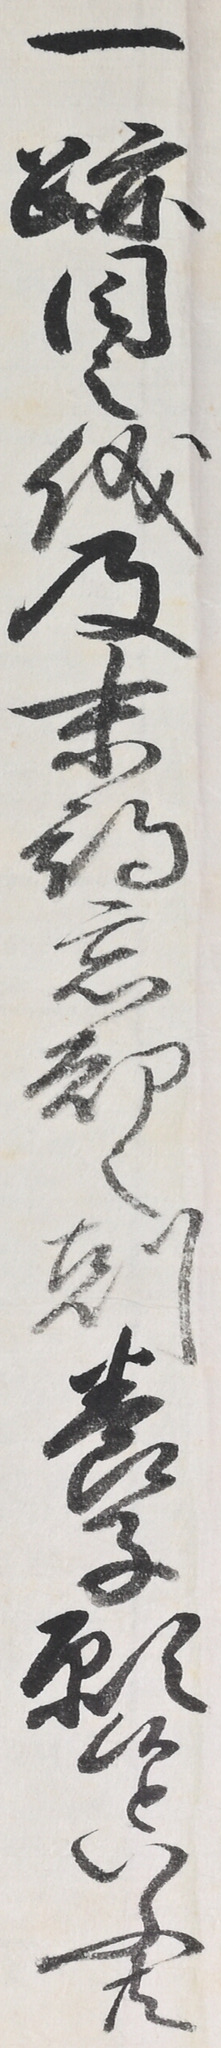一跡目之儀及末期忘却之刻養子願候といふ共
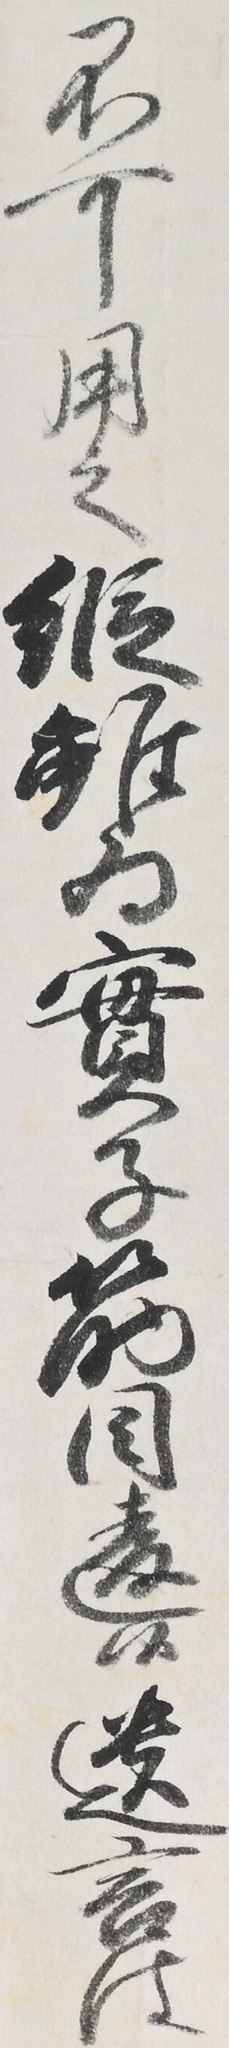不可用之縦雖為實子筋目違候遺言は
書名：御条目
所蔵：伊那市立高遠町図書館・合同会社AMANE
